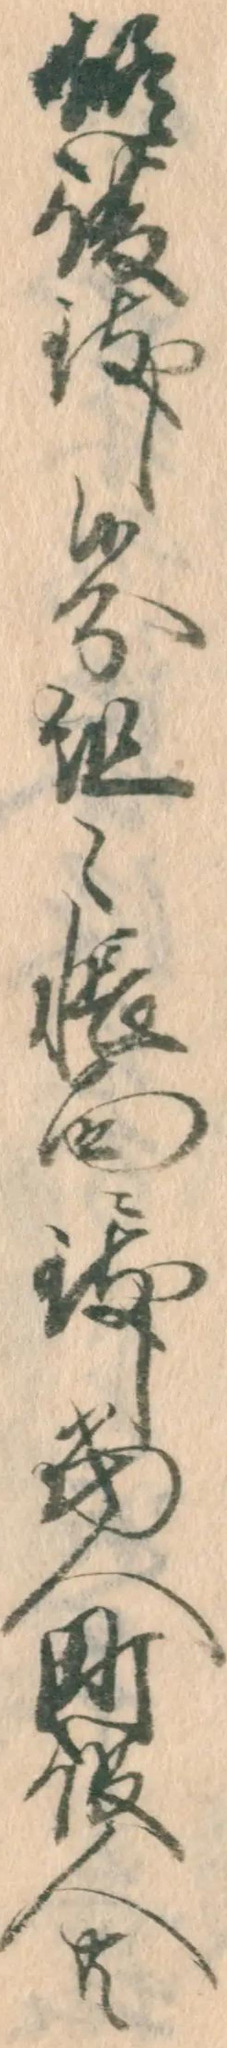修復致し候分組々帳面ニ致し当人町役人共
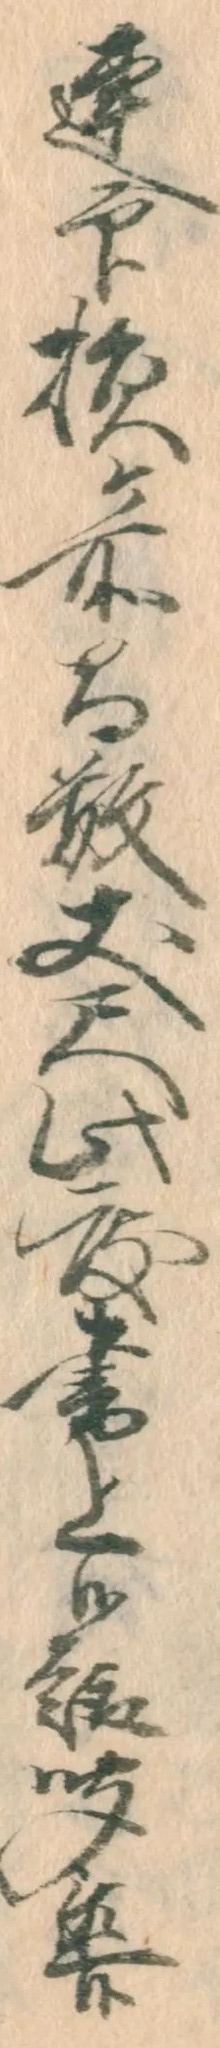連印損ヶ所間数丈尺此度書上候趣聞置候

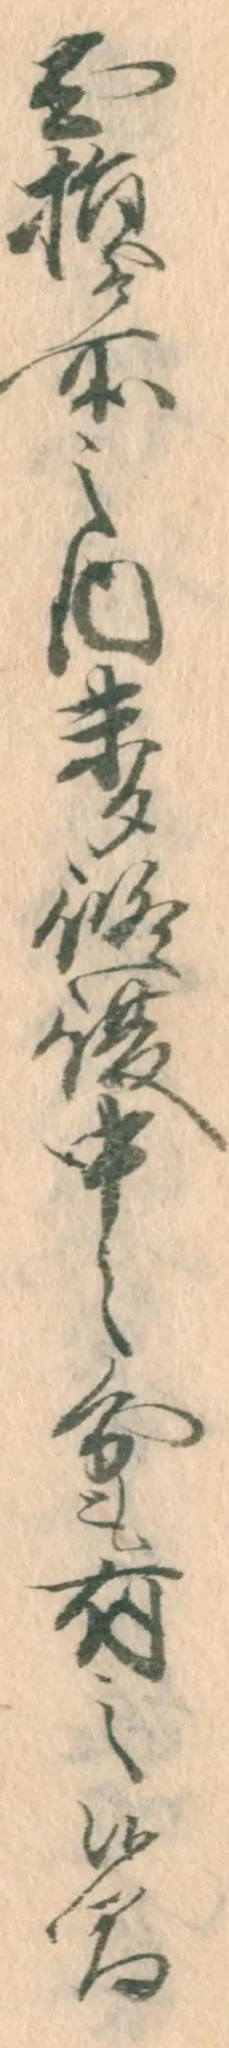尤損ヶ所之内未タ修復中之分も有之候間
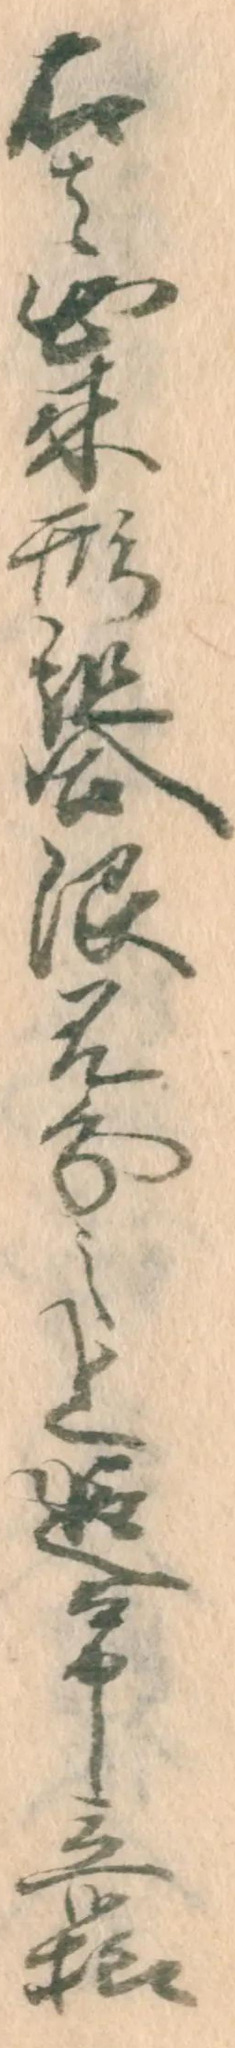右は出来形組合限見分之上追而申立候様
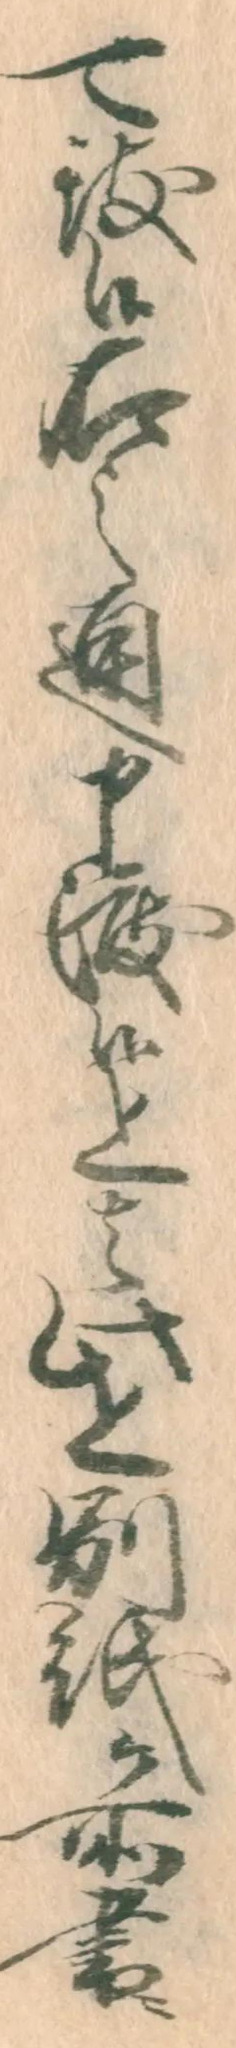可致候右之通申渡候上は此上別紙ヶ所書ニ
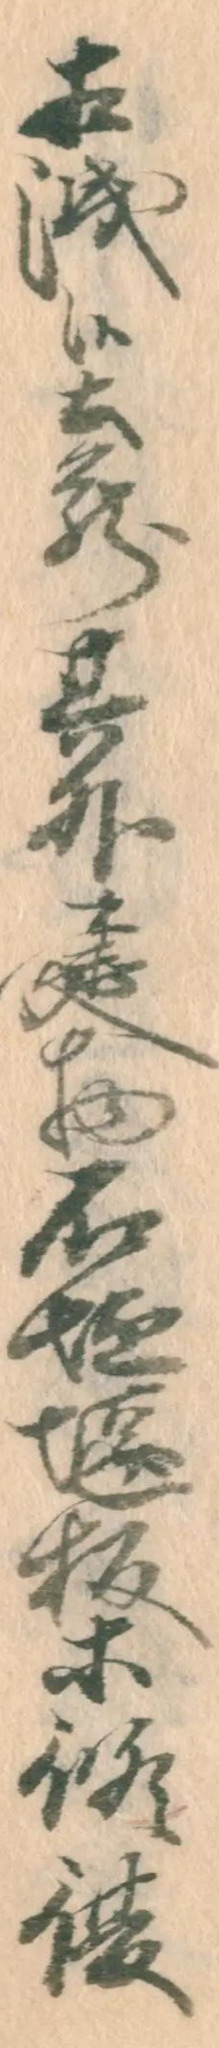相洩候土蔵其外建物石垣堰板等修復
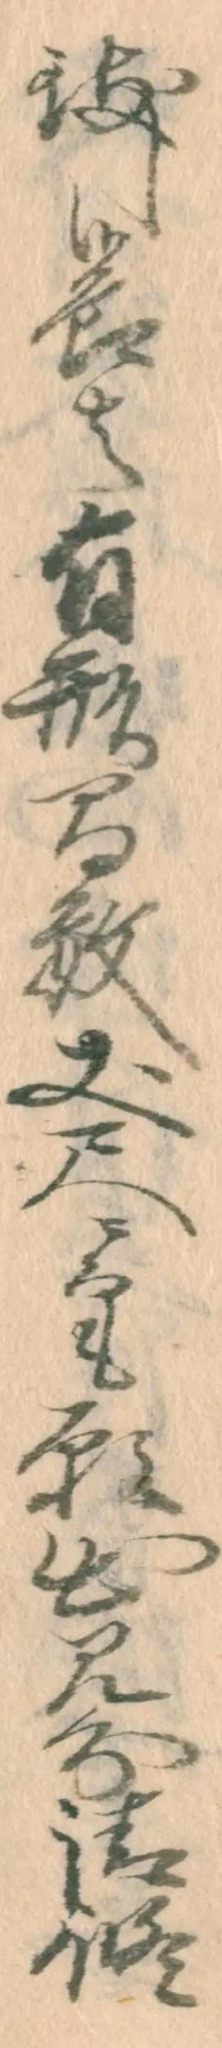致し候節は有形間数丈尺ニ而も願出見分請修
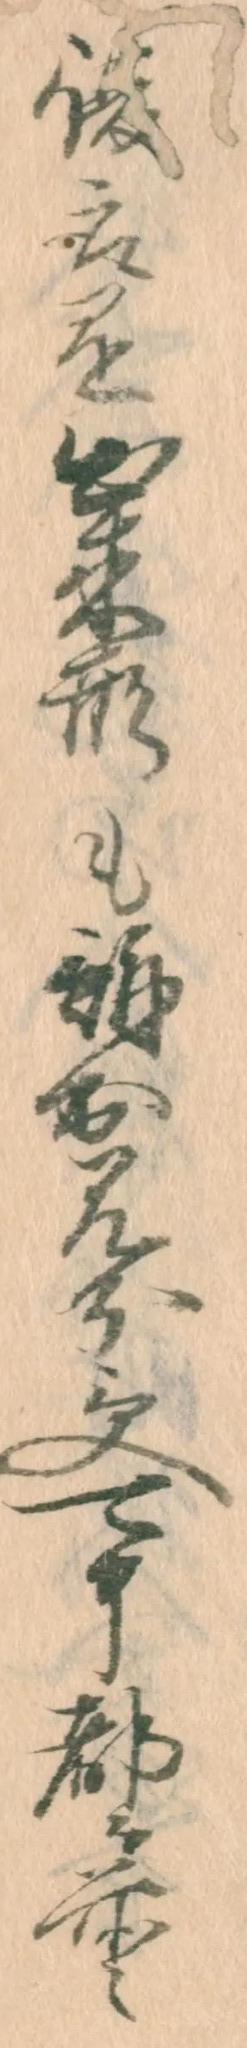復取懸出来形も訴出見分受可申都而前之

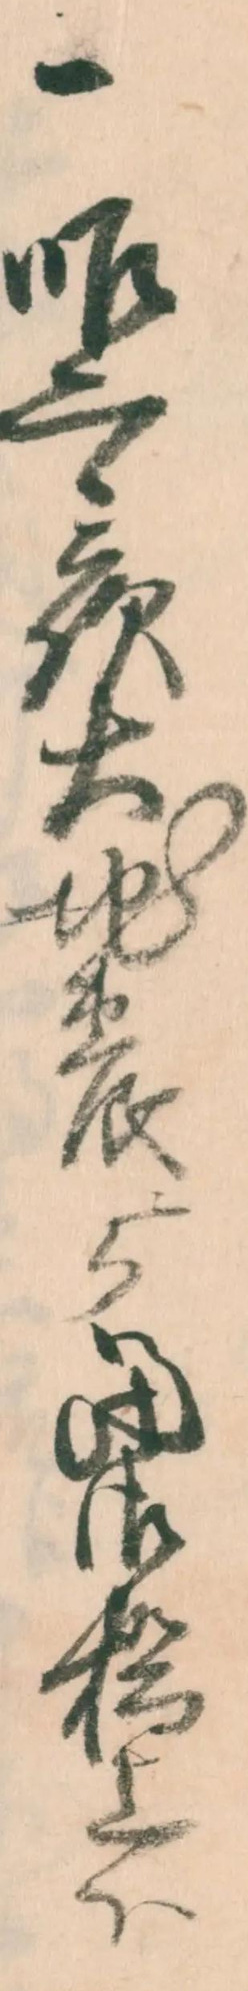一昨二日夜大地震ニ而当御橋上は
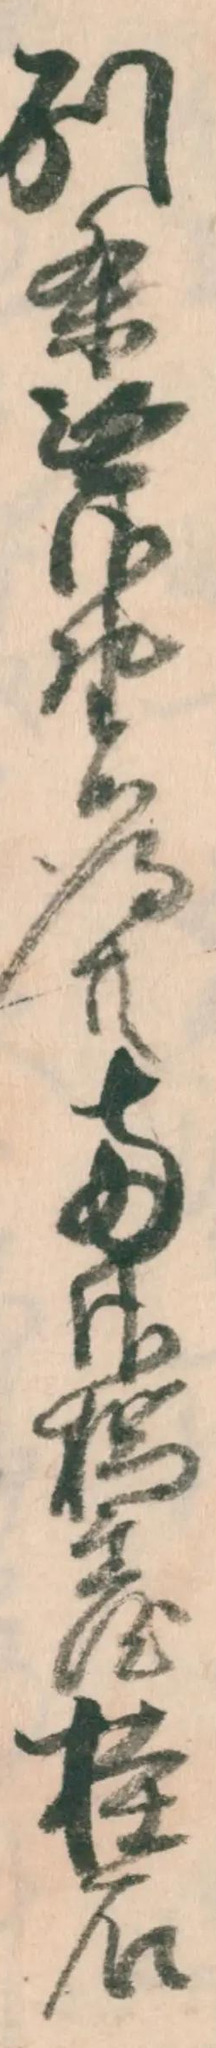別条無御座候得共両御橋台柱石
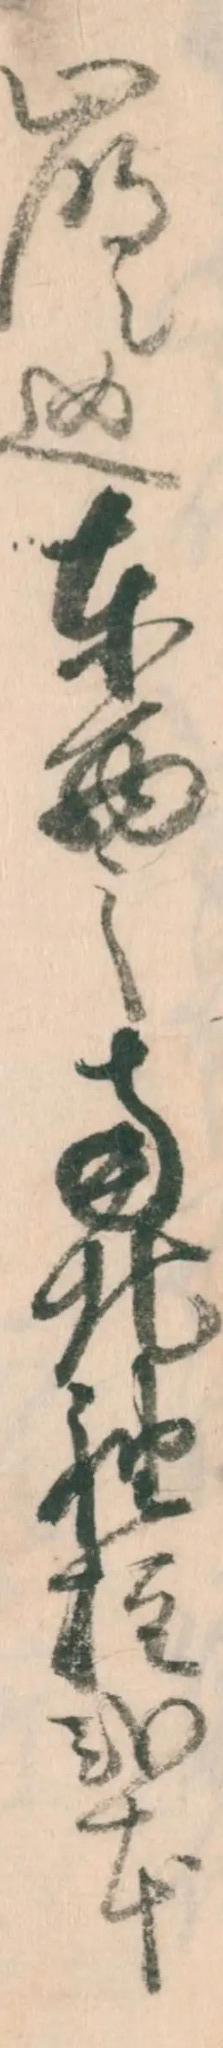崩レ込東西之南北袖柱弐本
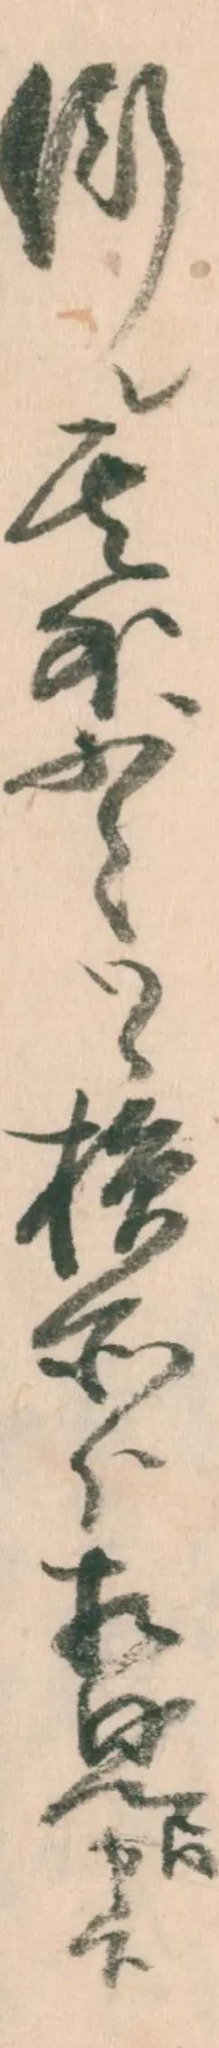倒レ其外少々ツヽ損所は相見え申候
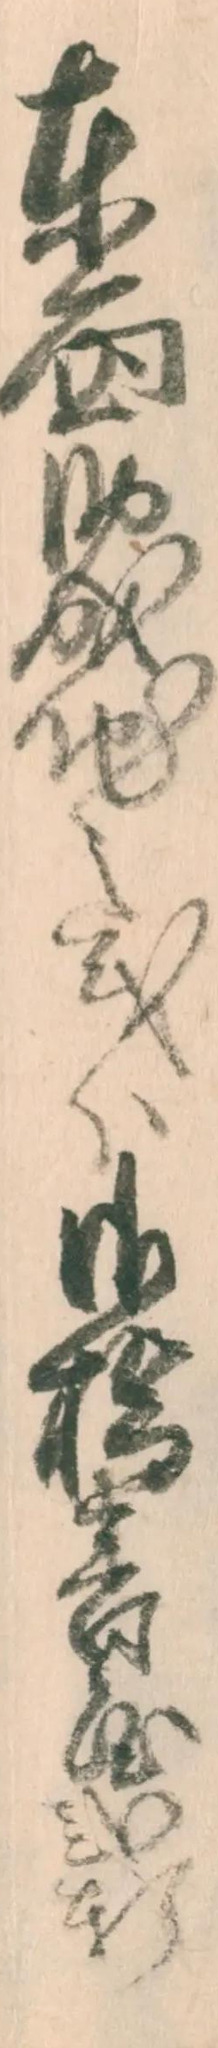東西助成地之義は御橋番屋弐軒
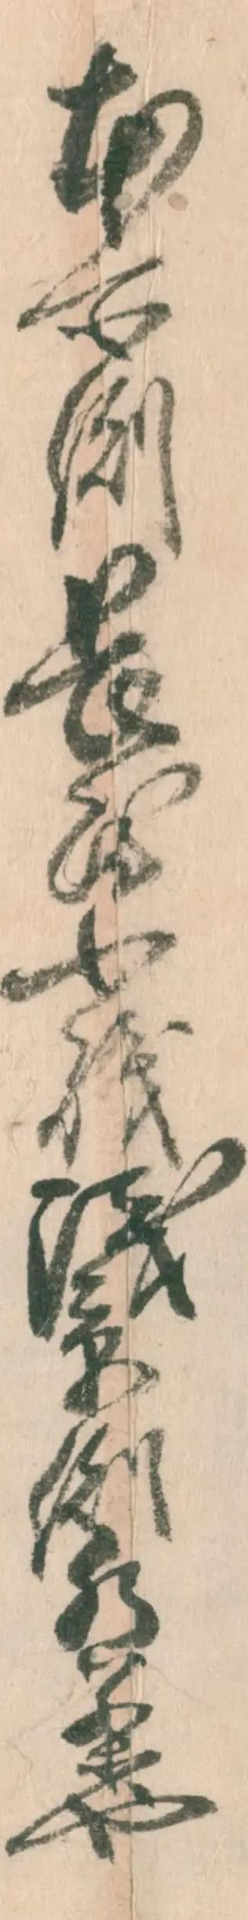本所側長屋不残浅草側水茶や
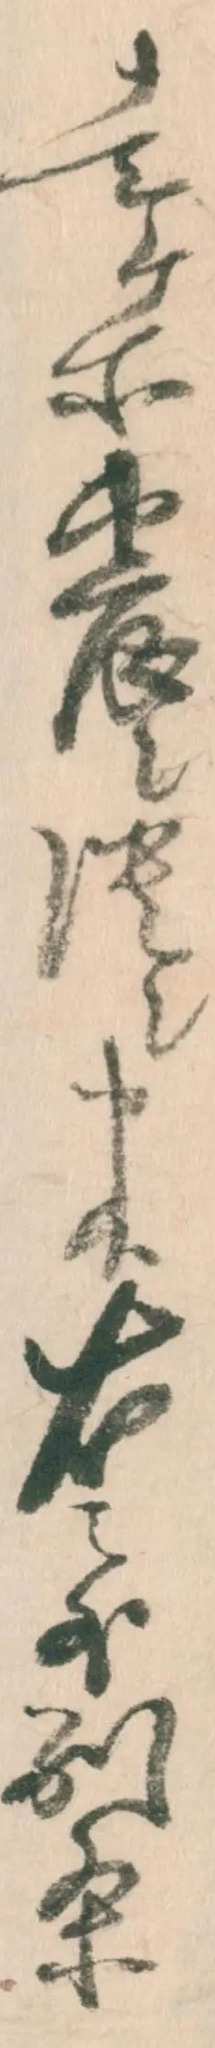壱ヶ所震レ潰レ申候右之外別条
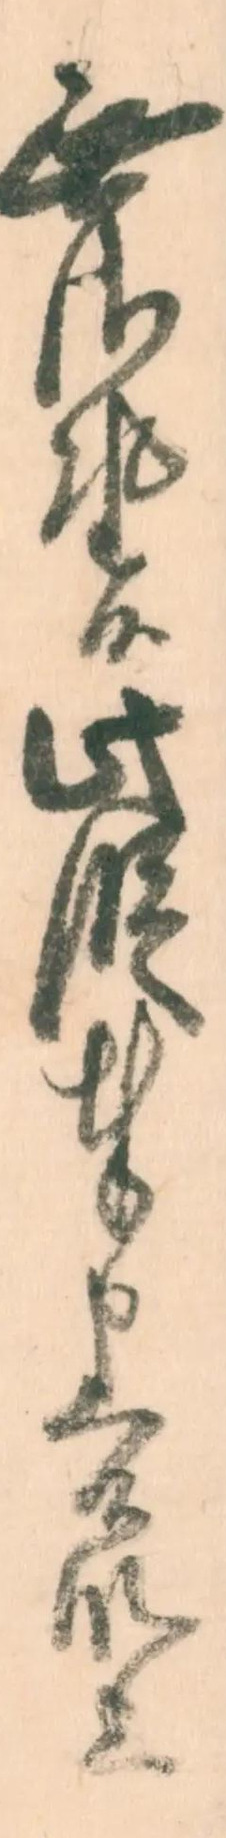無御座候此段奉申上候以上
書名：地震災書留 2巻. [1] 内表紙に「地震災書留　安政二卯年　但本所深川御用屋敷地代免除調」とあり
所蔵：国立国会図書館 National Diet Library, JAPAN
